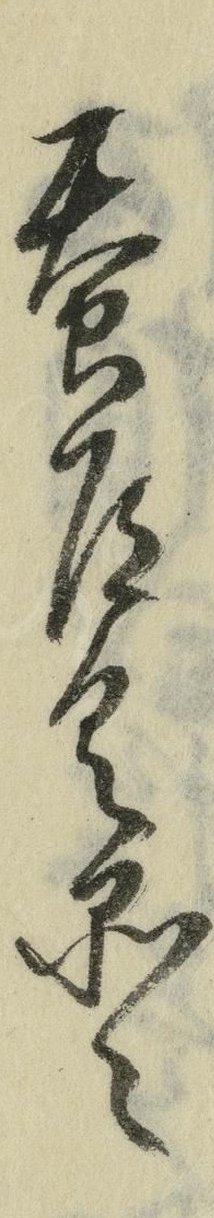一蚕道具品々

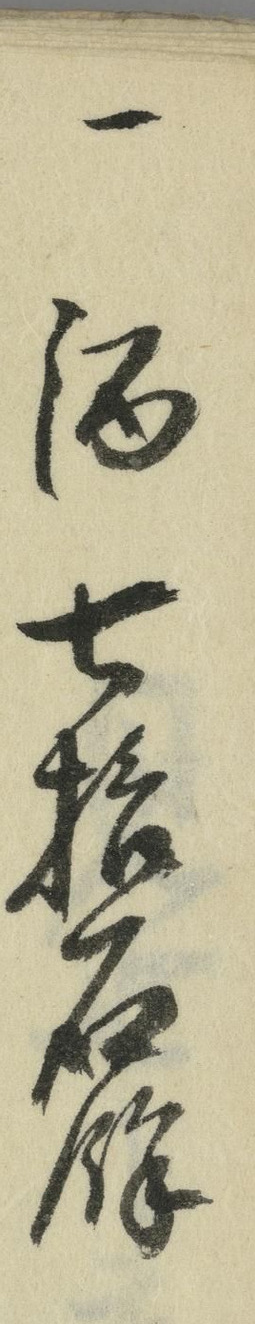一酒七拾石餘
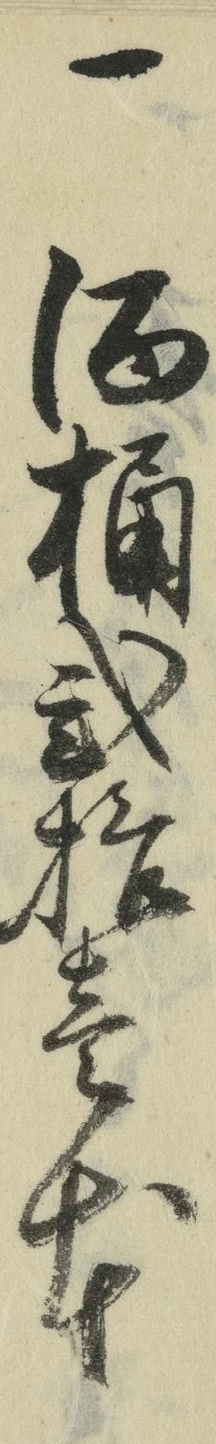一酒桶弐拾壱本
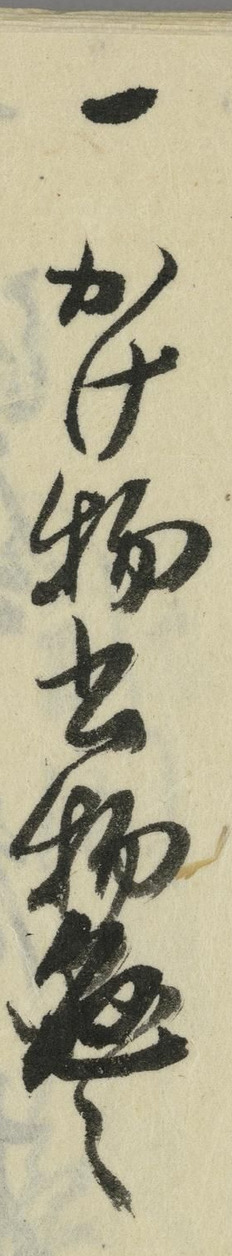一かけ物書物色々
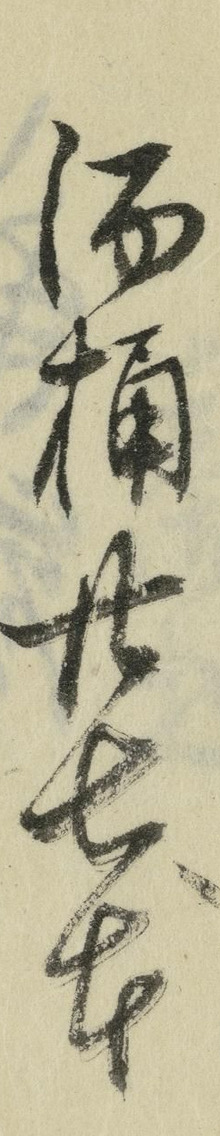一酒桶廿七本
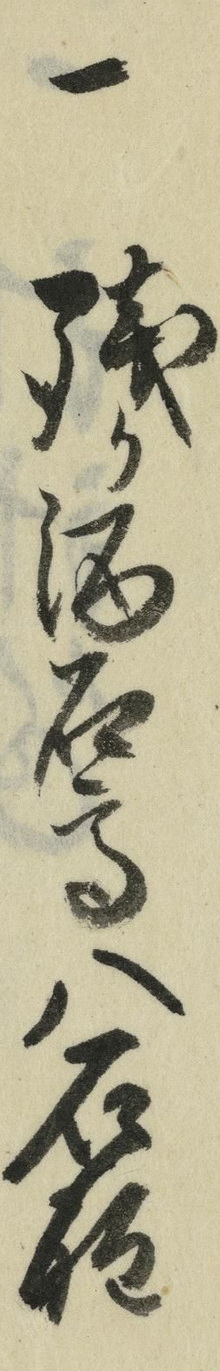一残り酒石高八石程
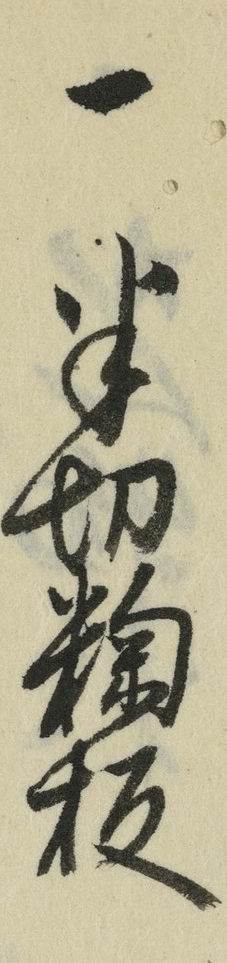一半切麹板
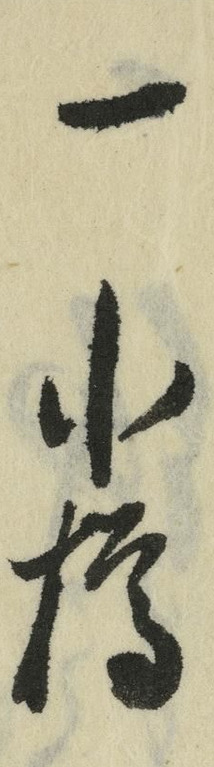一小樽
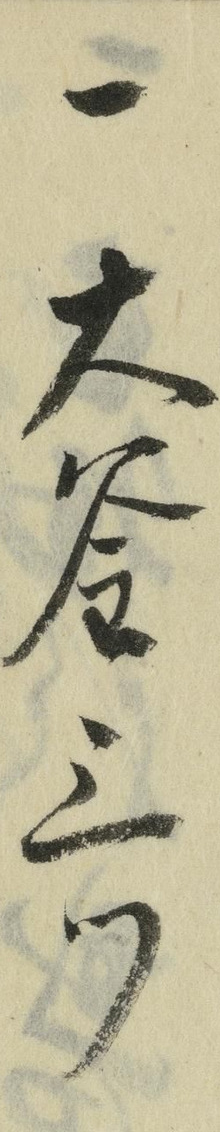一大釜三ッ

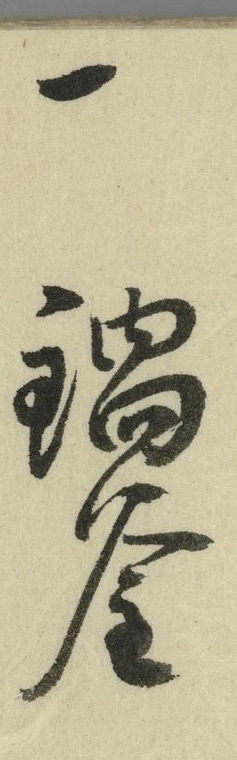一鍋釜

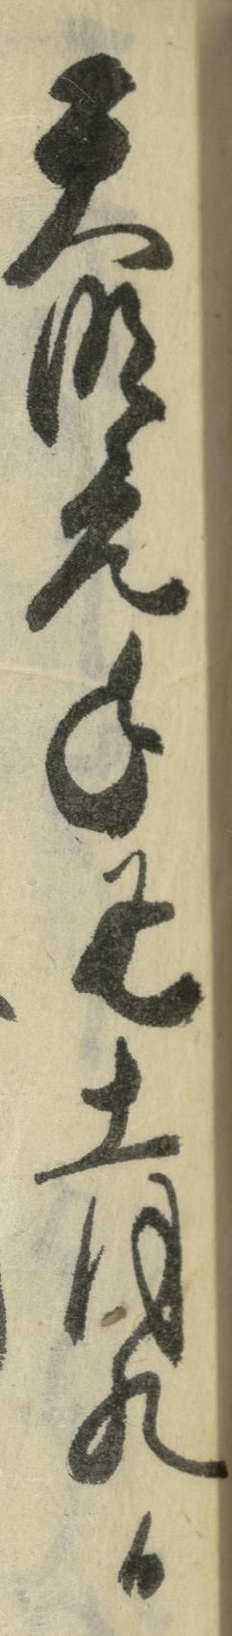天明元年丑十一月九日
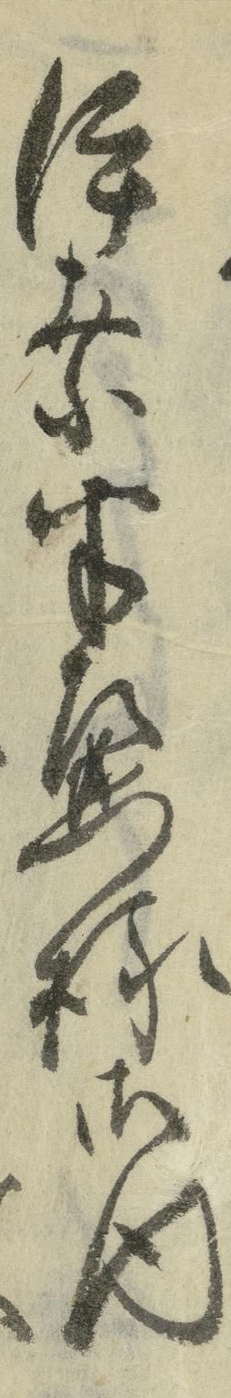伊奈半左衛門様御内
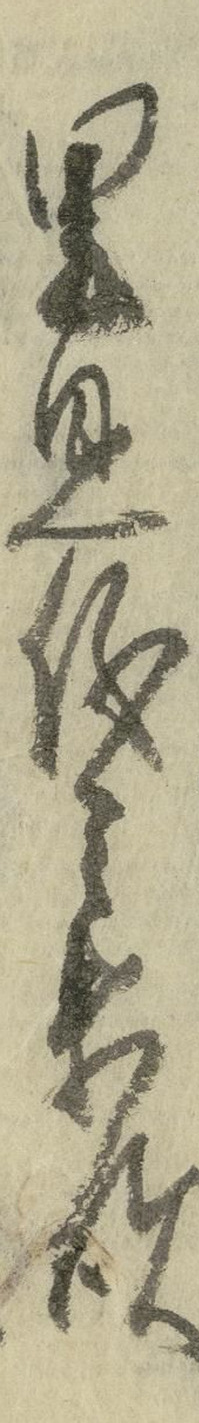里見儀兵衛様
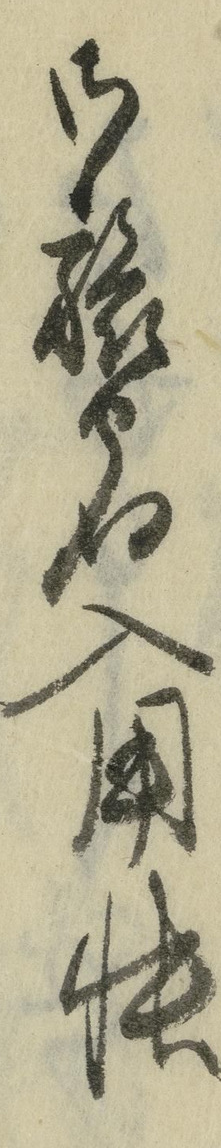御旅宿入用帳
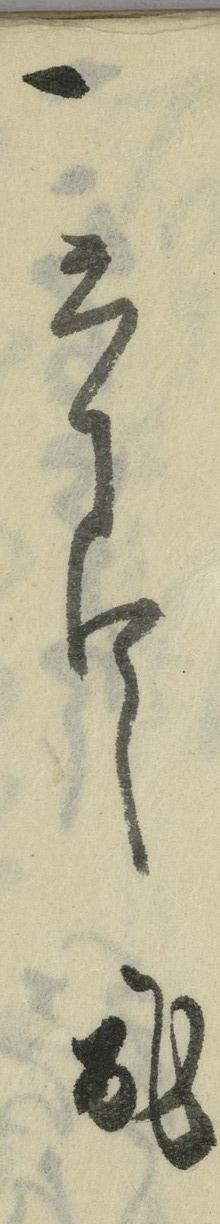一六十四文酢

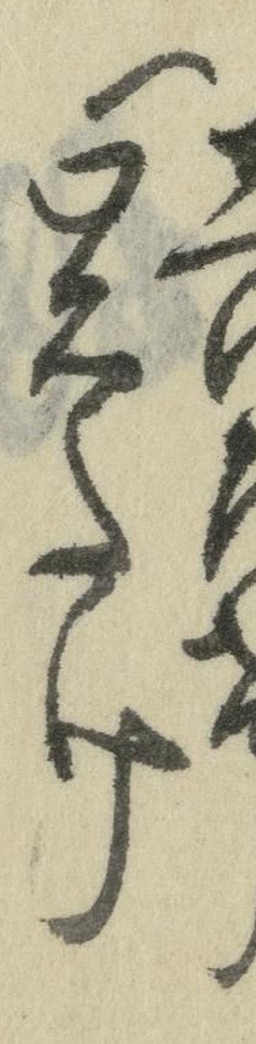黒たけ
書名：天明淺間噴火ニ関スル書類
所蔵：東京大学地震研究所図書室 Earthquake Research Institute Library, The University of Tokyo, JAPAN
